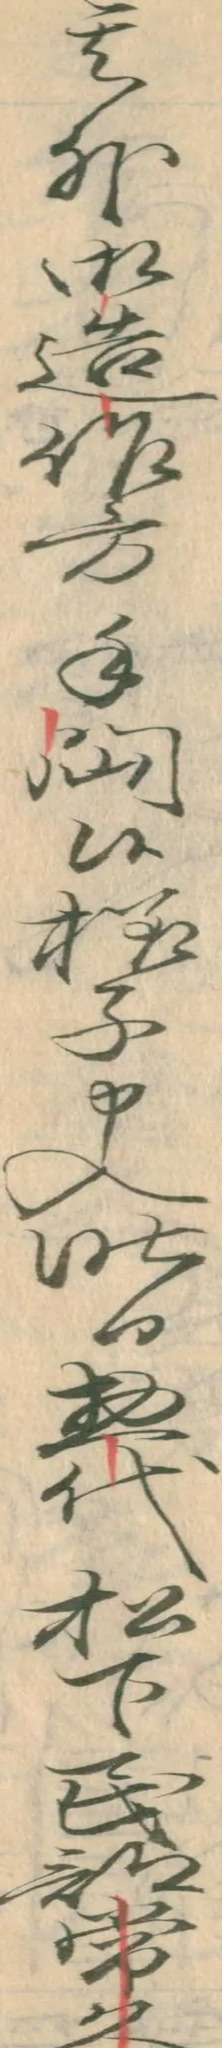其外御-造-作方手_閊候様子申入昨日惣-代松下民部常久
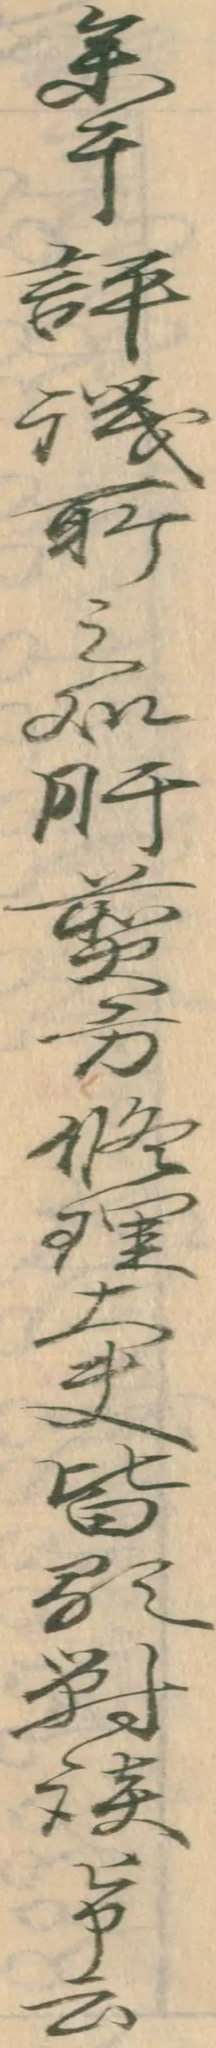参于評議所之処肝煎方修理大夫皆顕対談被申云
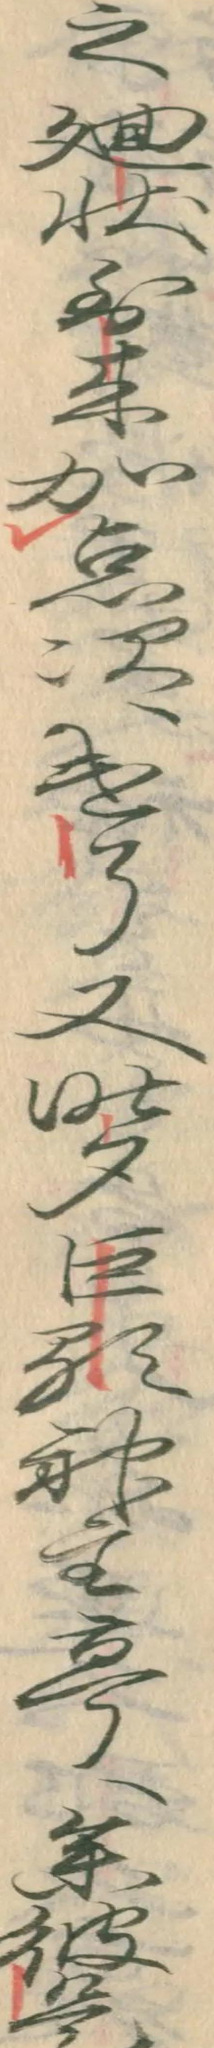之廻-状到-来加点次へ遣_了又昨-夕巨顕神主亭へ参彼_是

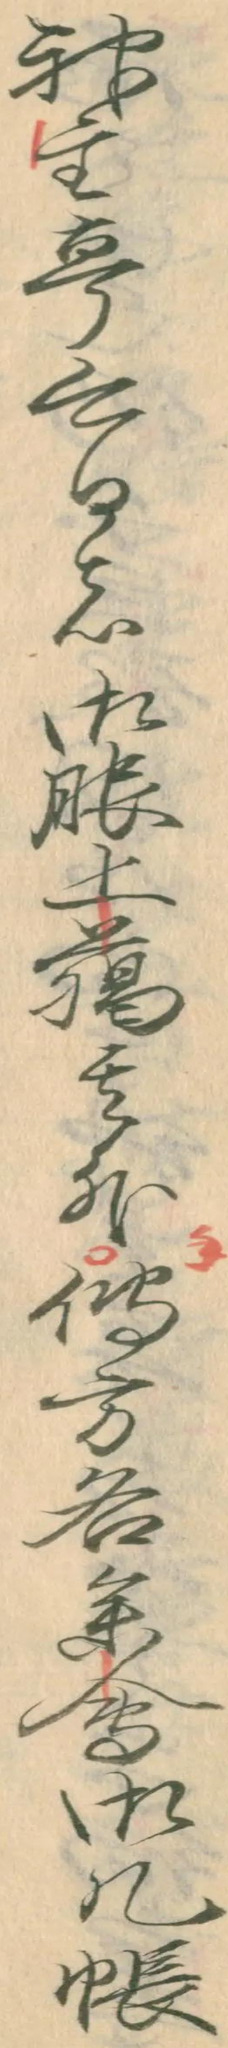神_主亭今日者御服上-臈其外￮伝方各参-会御几帳
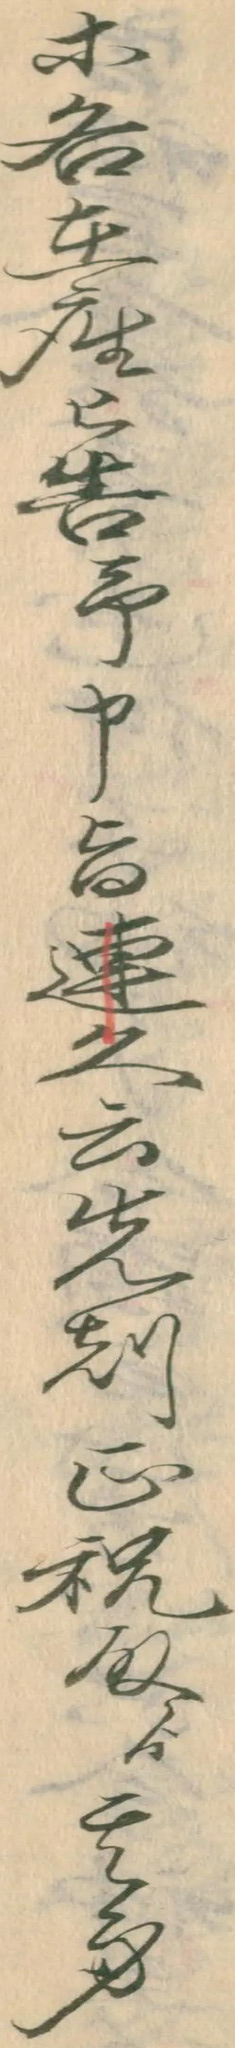等各在座被告予申旨連久云先刻正祝殿ゟ其身
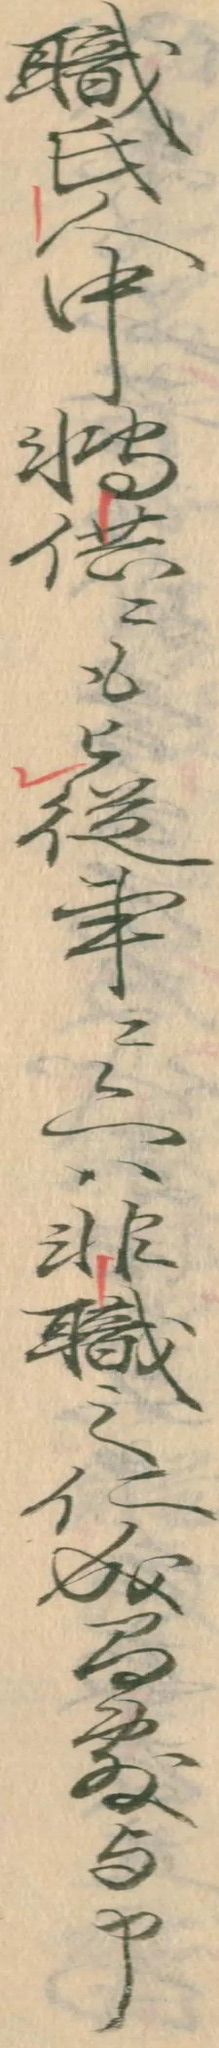職氏中転-供ニも被従事ニ候へハ非-職之仁成間敷与申
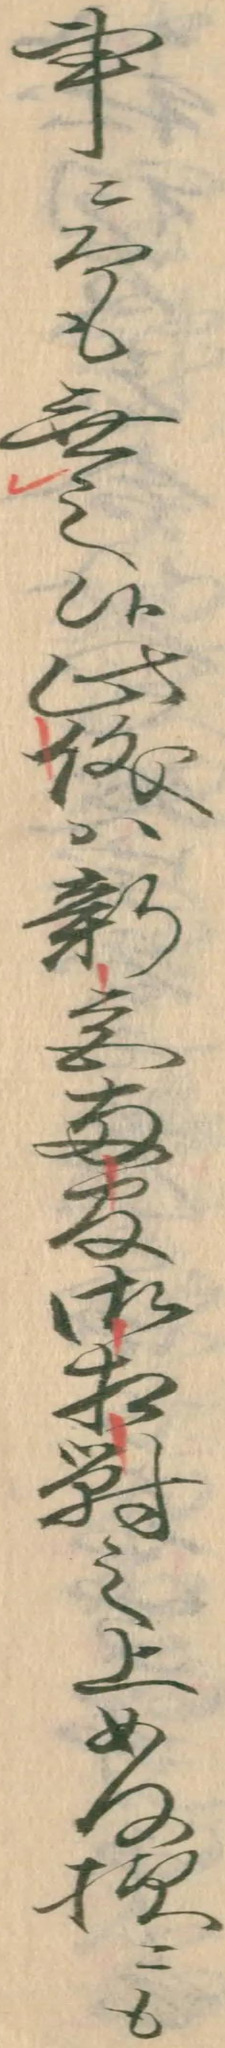事ニ而も無之候此_儀ハ新-宮両-官御-相-対之上如何様ニも
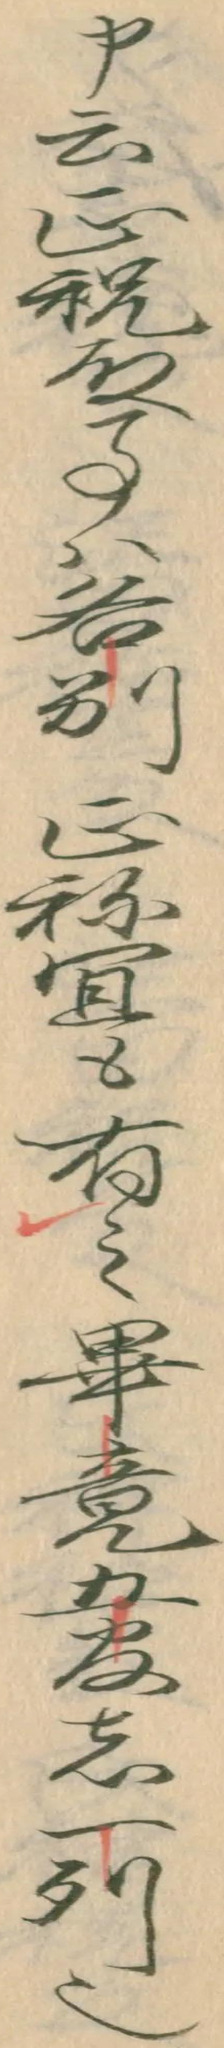申云正祝故事ハ各-別正祢宜も有之畢-竟五-官者一-列也
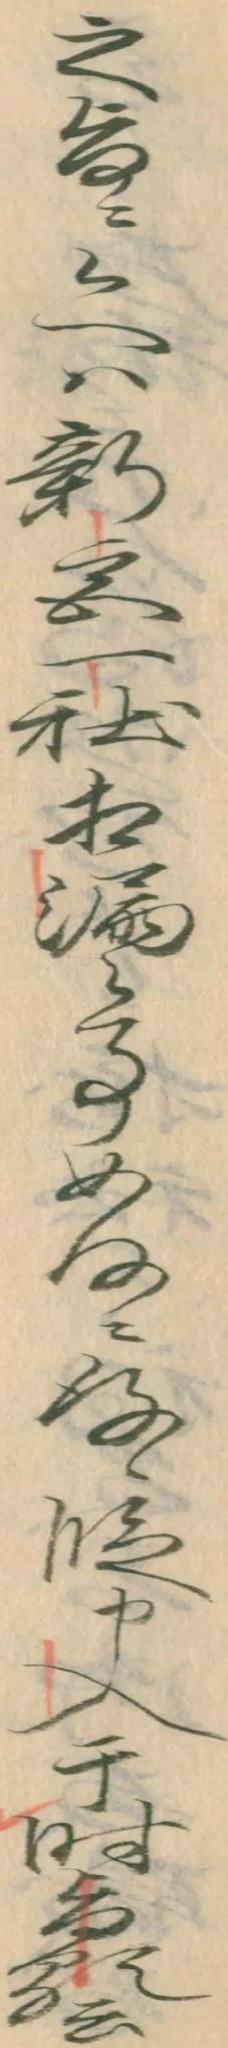之旨ニ候へハ新-宮一-社相_漏候事如何ニ存候段申_入于時旨顕云
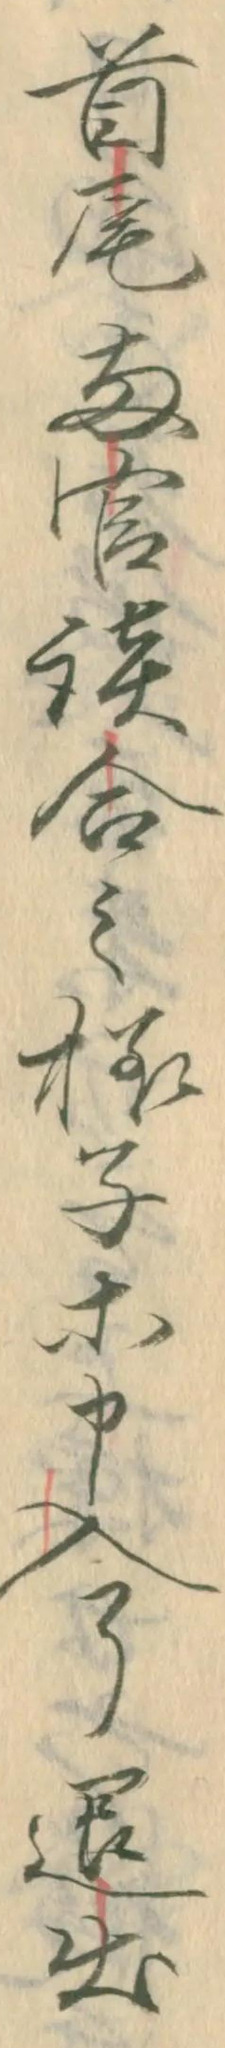首-尾両-官談-合之様子等申_入了退-出

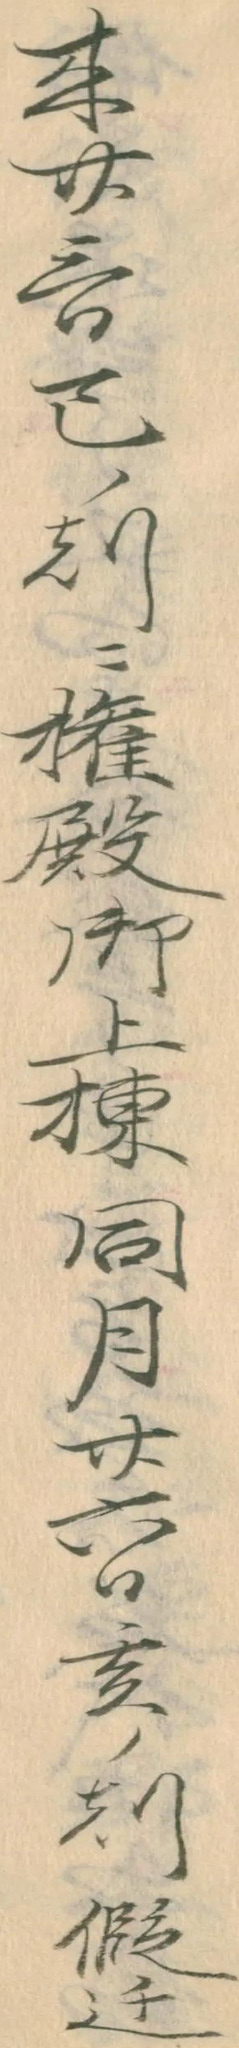来廿三日巳ノ刻ニ権殿御上棟同月廿六日亥ノ刻仮迁
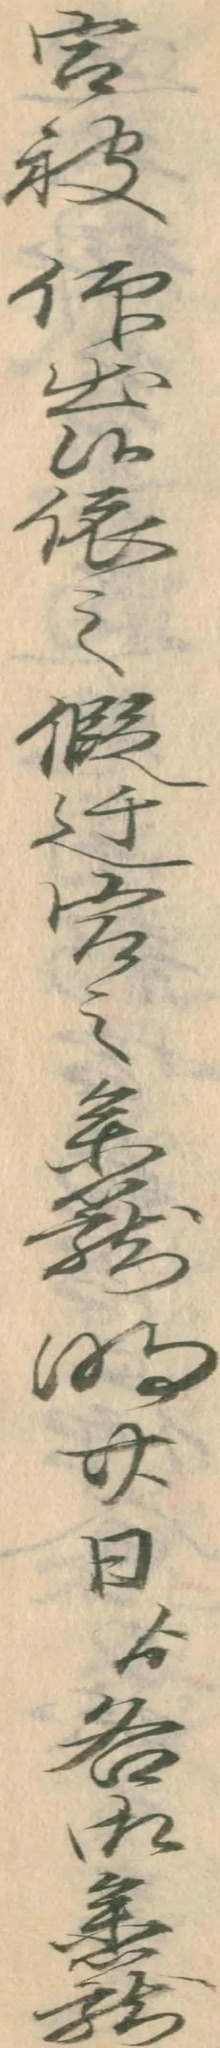宮被仰出候依之仮迁宮之参籠明廿日ゟ各御参籠
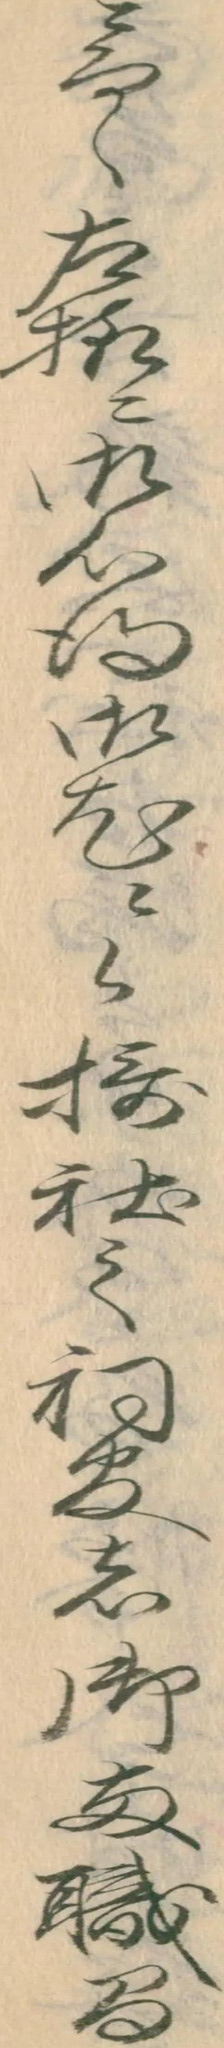ニ而候左様ニ御心得御尤々々摂社之祠官者御両職間
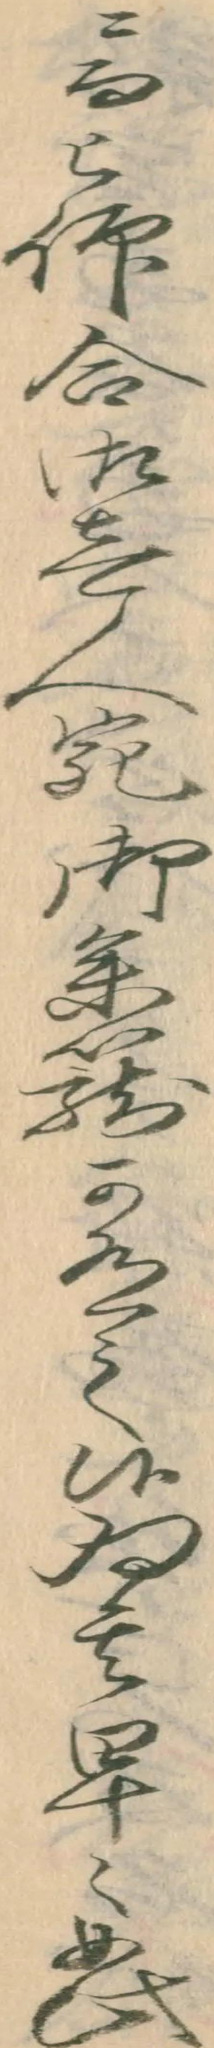ニ而被仰合御壱人宛御参籠可有之候為其早々如此
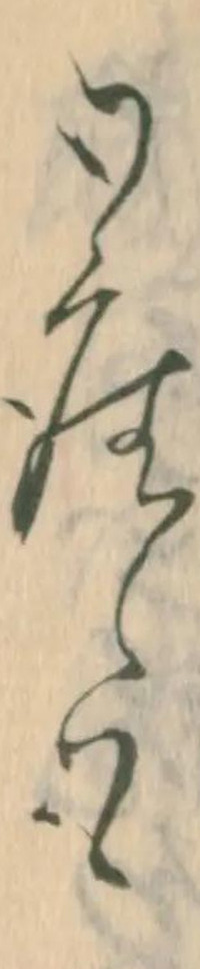御座候以上
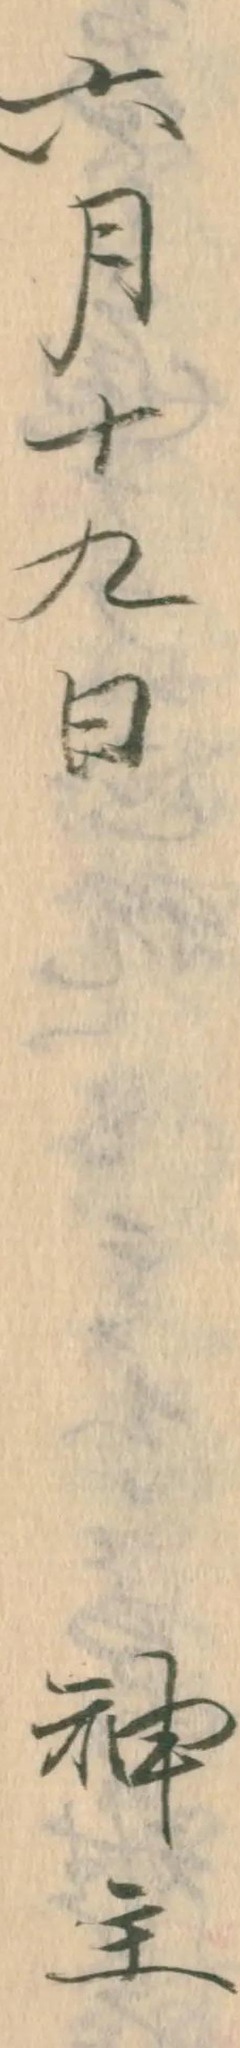六月十九日神主
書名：賀茂社記録. 第15冊
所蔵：国立国会図書館 National Diet Library, JAPAN
